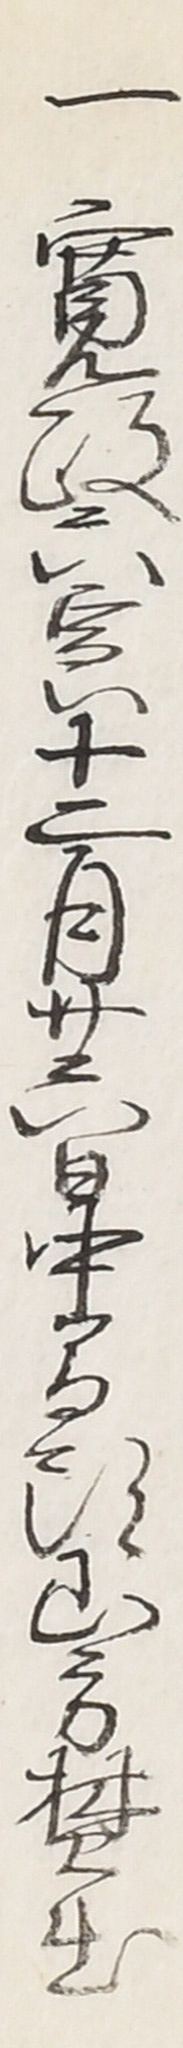一寛政六寅十二月廿六日中間頭山方焚出
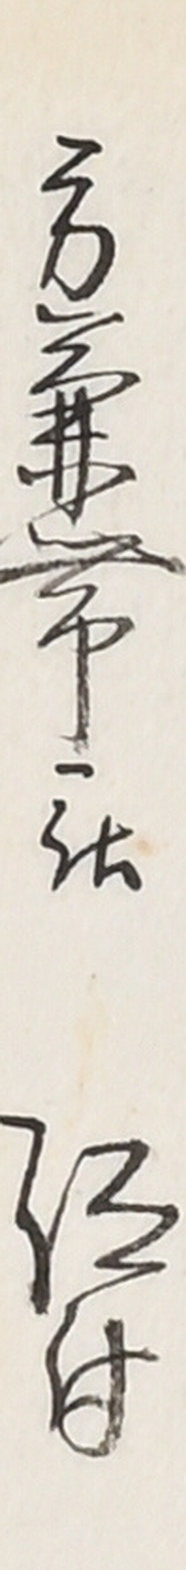方兼帯被仰付
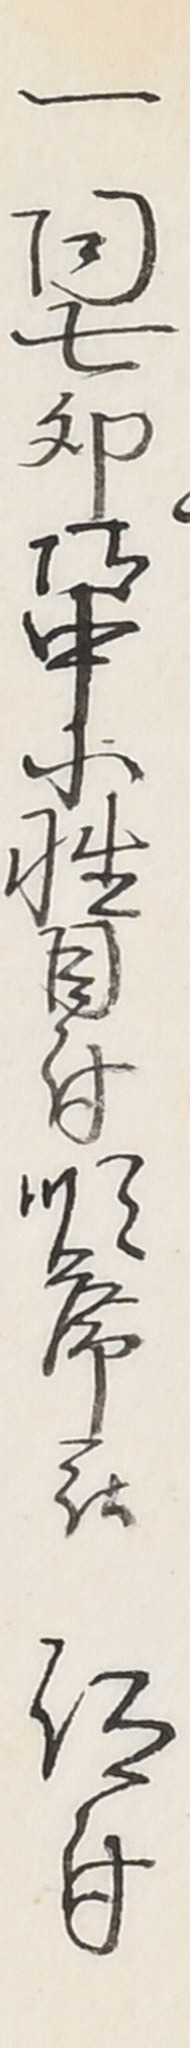一同七卯御中小性目付順席被仰付
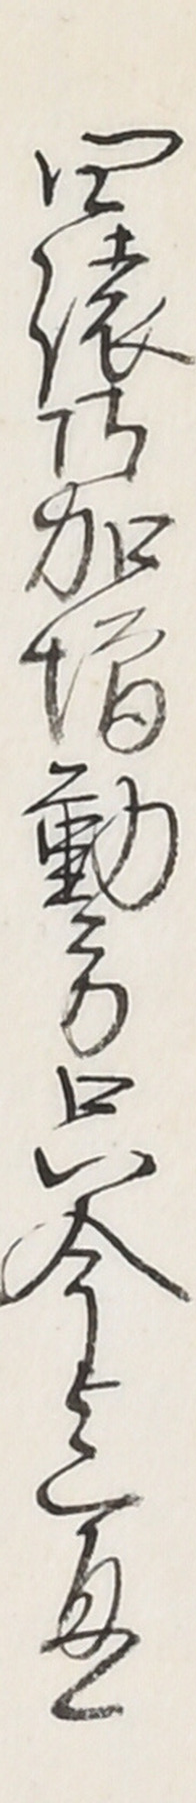四俵御加増勤方只今迄通
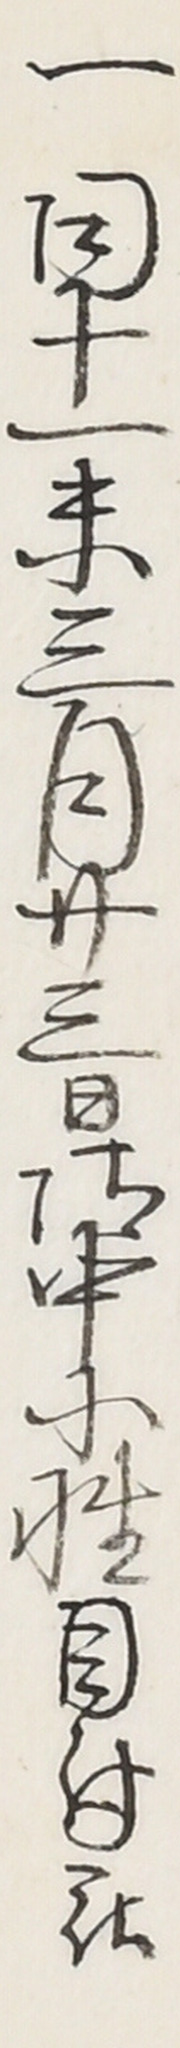一同十一未三月廿三日御中小性目付被
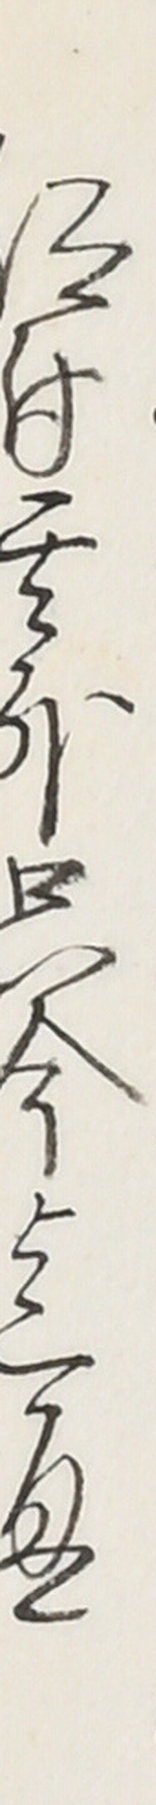仰付其外只今迄通
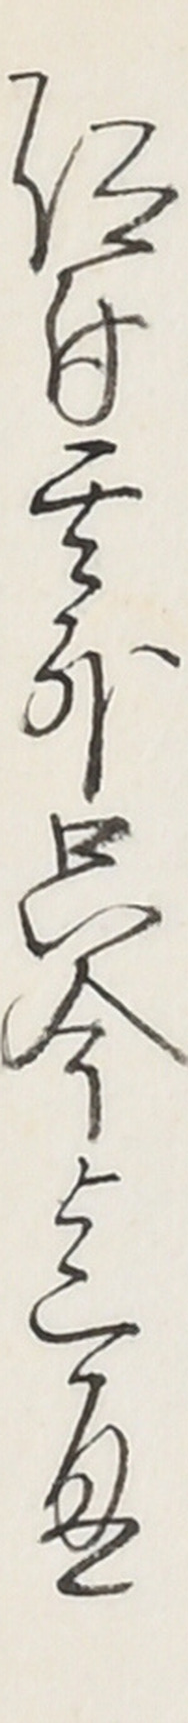仰付其外只今迄通
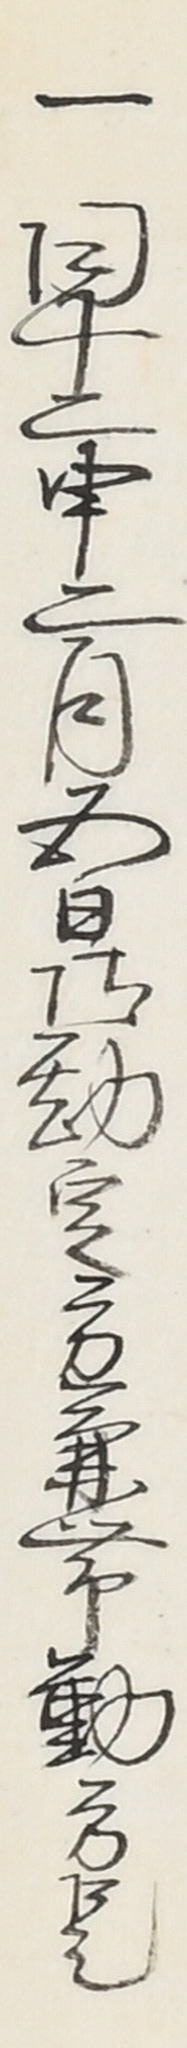一同十二申二月五日御勘定方兼帯勤方是
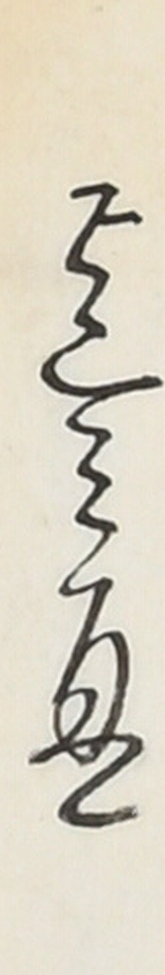迄之通
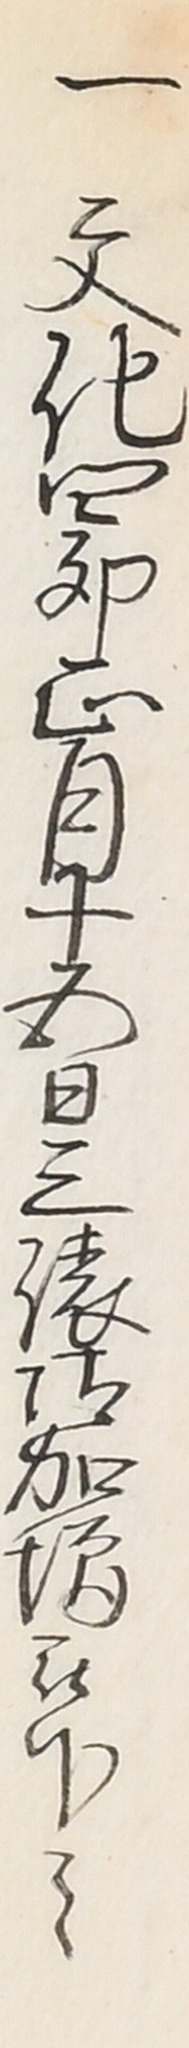一文化四卯正月十五日三俵御加増被下之
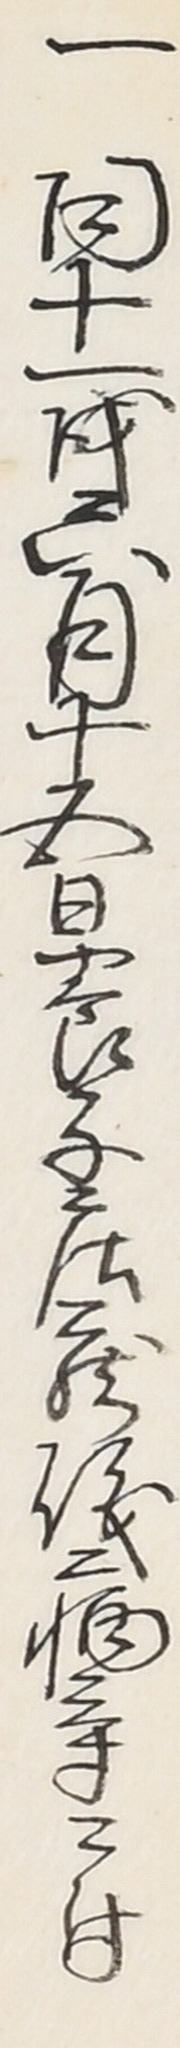一同十一戌六月十五日養子庄蔵儀病気ニ付
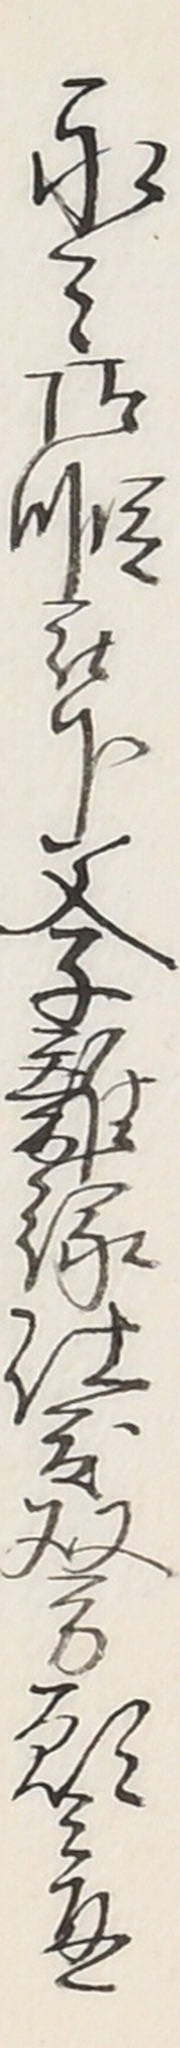永之御暇被下父子離縁仕度双方願之通
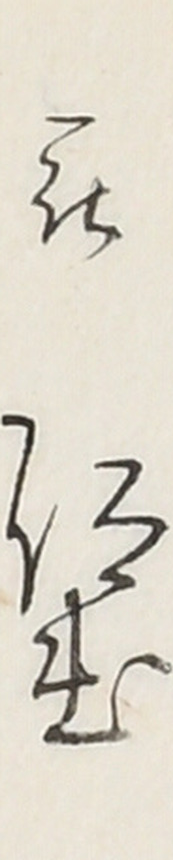被仰出
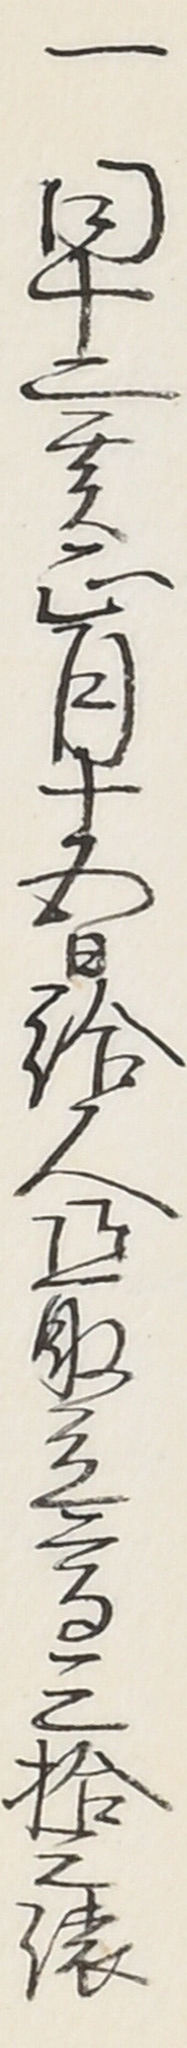一同十二亥正月十五日給人御取立高三拾三俵
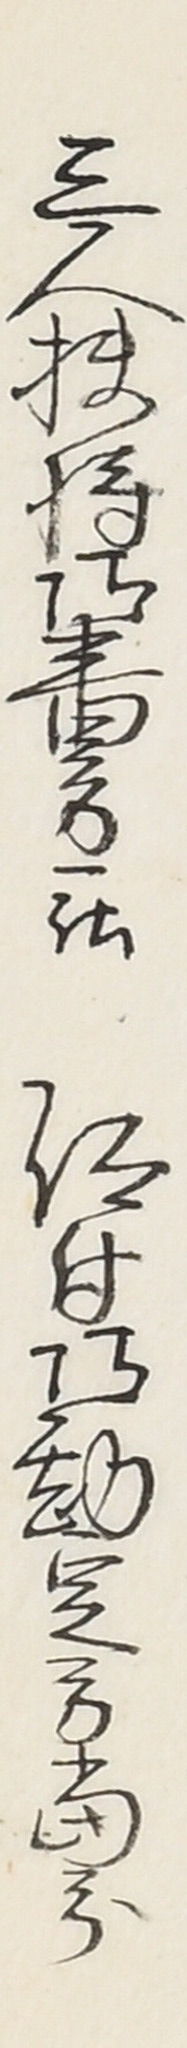三人扶持御番方被仰付御勘定方当分
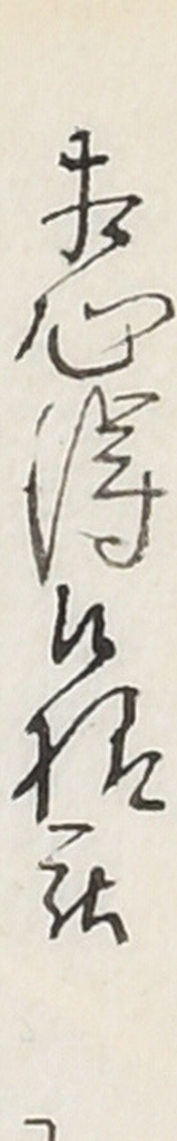相心得候様被仰出
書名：給人諸士勤仕録（七）
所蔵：伊那市立高遠町図書館・合同会社AMANE
